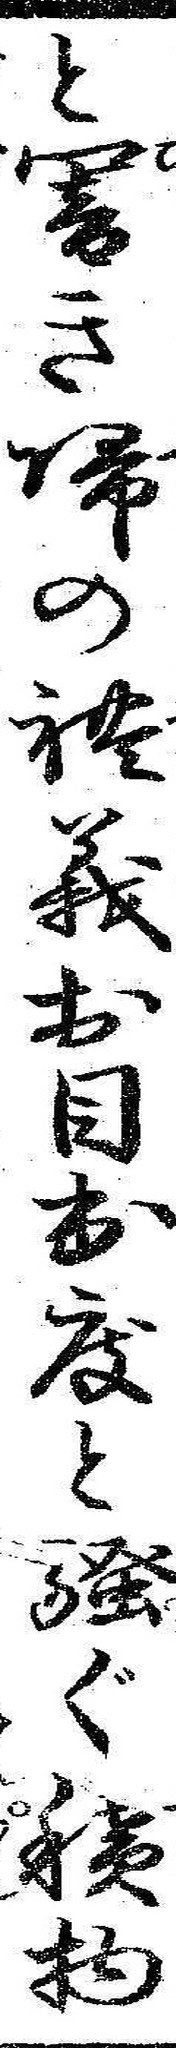と響き帰の礼義お目出度と騒ぐ積物
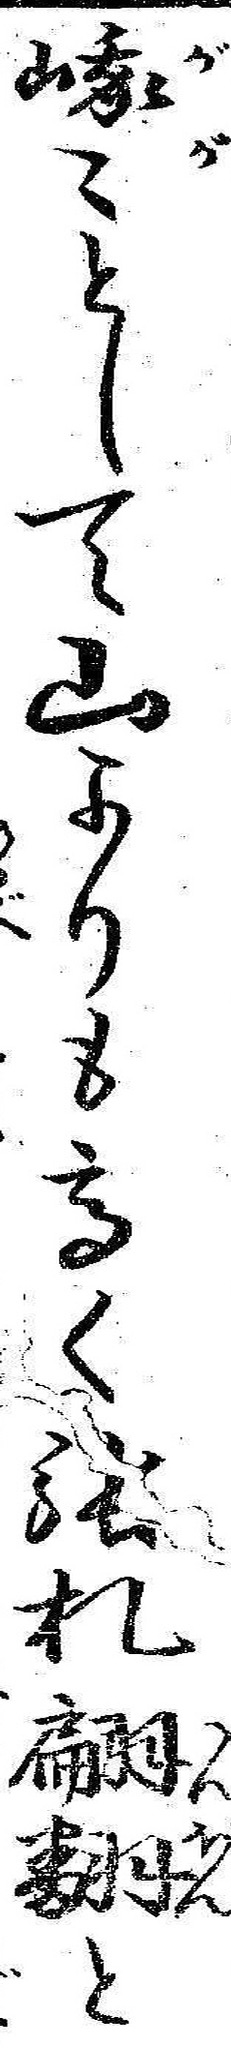峨々として山よりも高く張札翩翻と
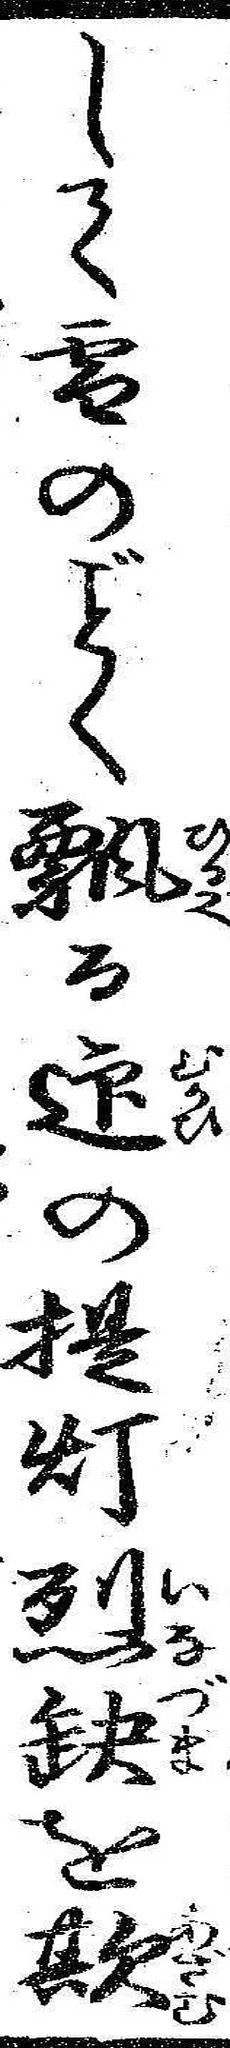して雪のごとく瓢る迎の提灯烈缺を欺
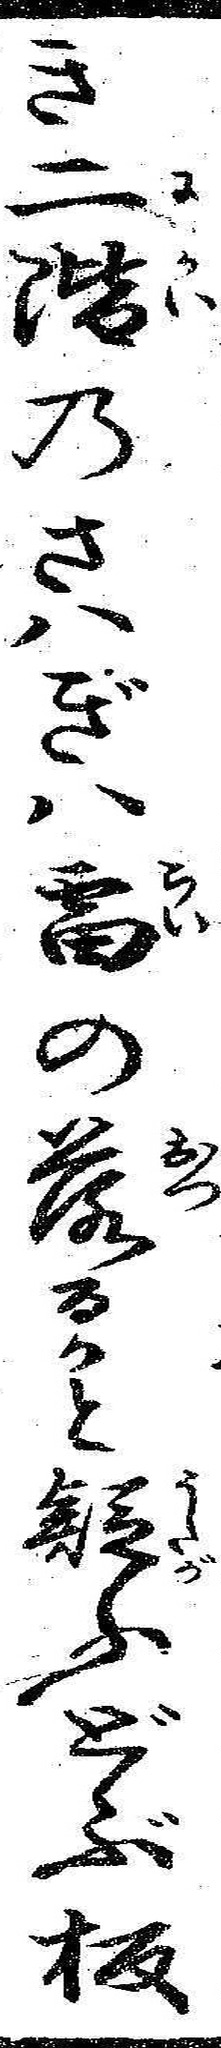き二階のさはぎは雷の落るかと疑ふどぶ板
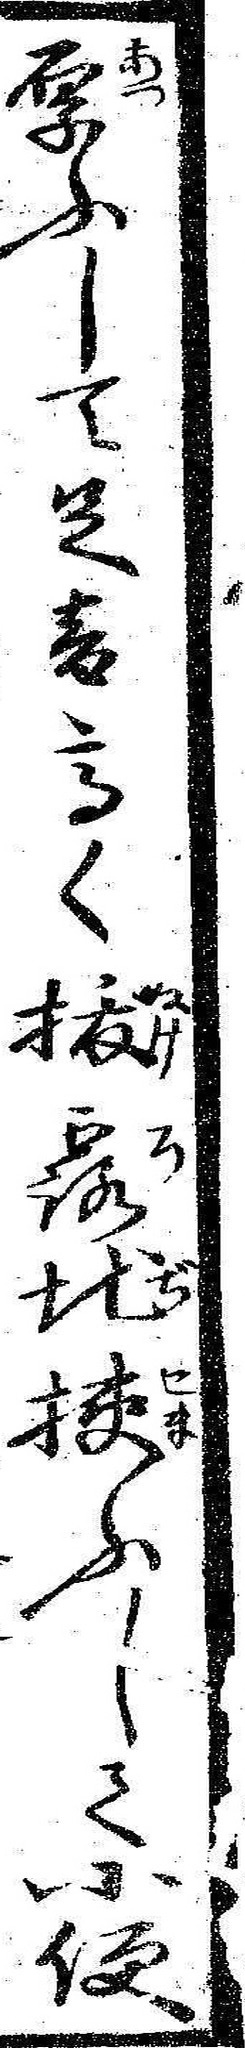厚ふして足音高く抜露地狭ふして小便
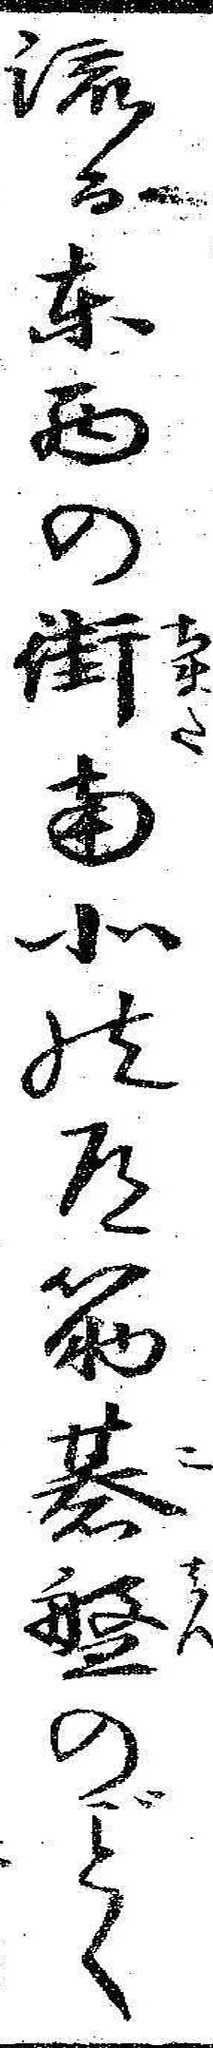流る東西の街南北の道筋碁盤のごとく
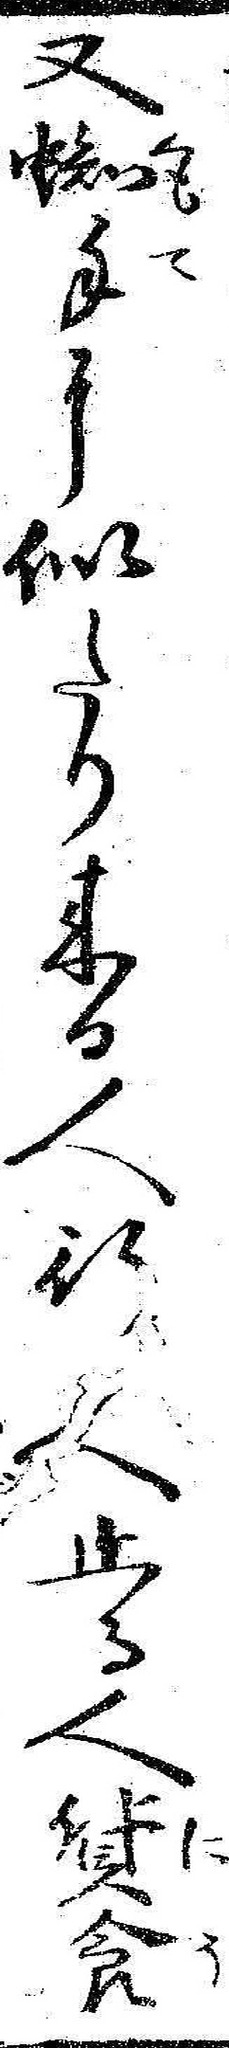又蜘手に似たり来る人行人止る人貸食
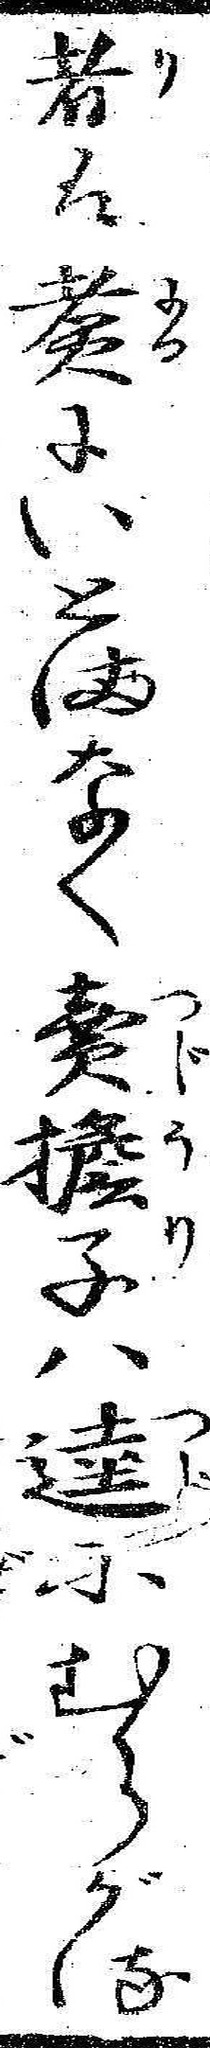者は煮にいとまなく売擔子は逵にむらがる
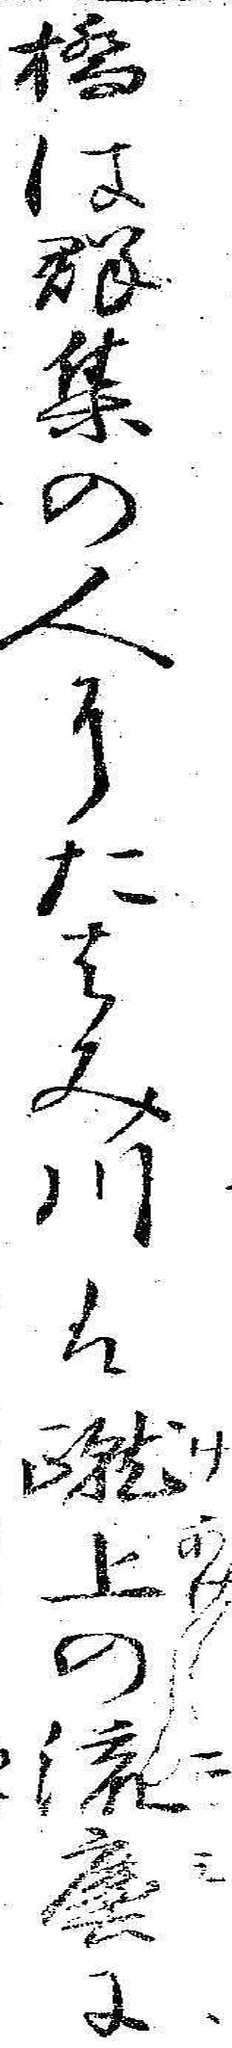橋は群集の人にたはみ川は蹴上の流塵に
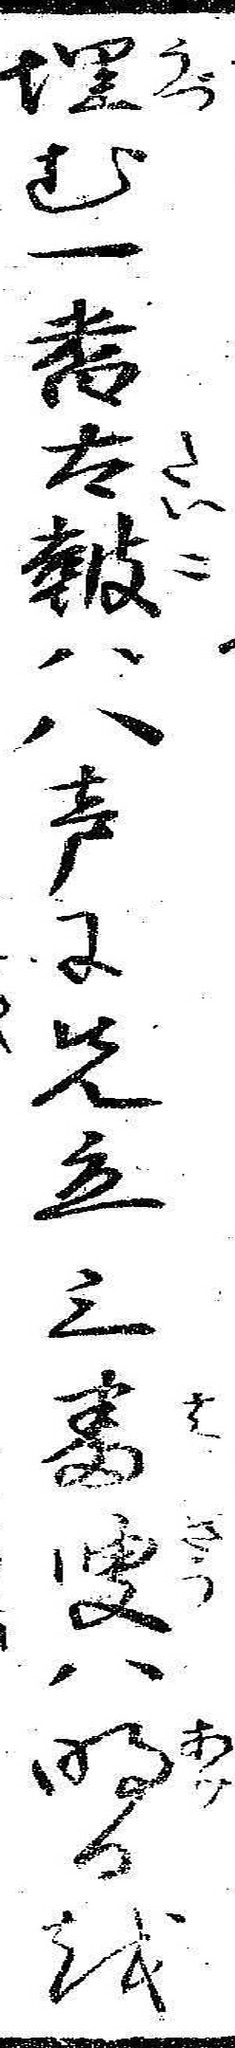埋む一番太鼓は八声に先立三番叟は明るを
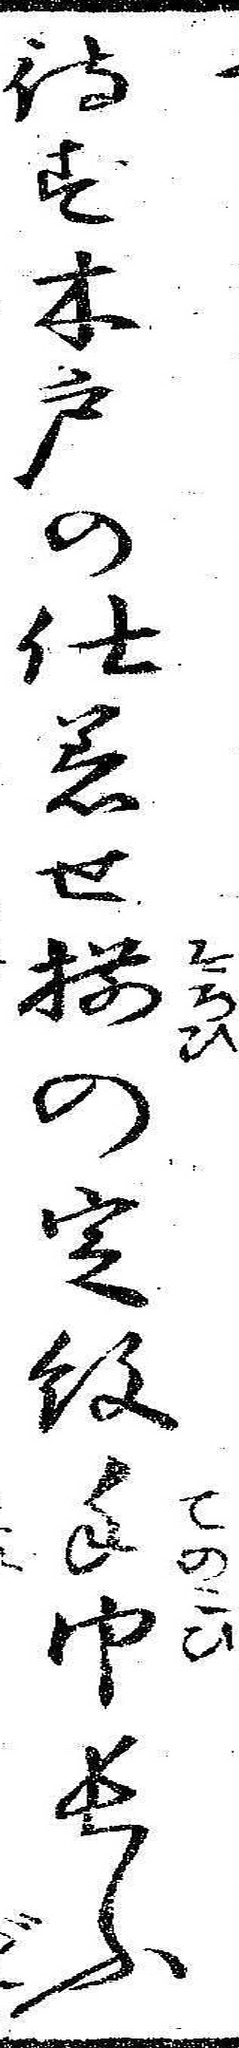待す木戸の仕着せ揃の定紋手巾長ふ
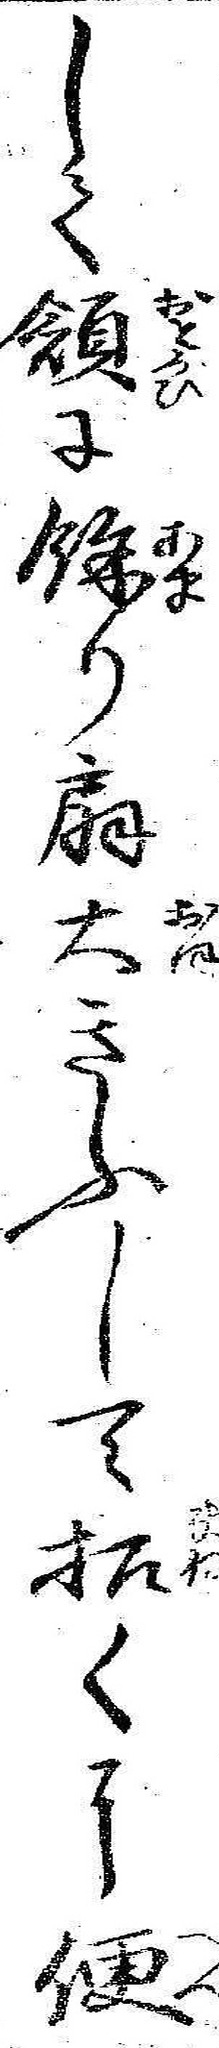して頷に余り扇大きふして招くに便
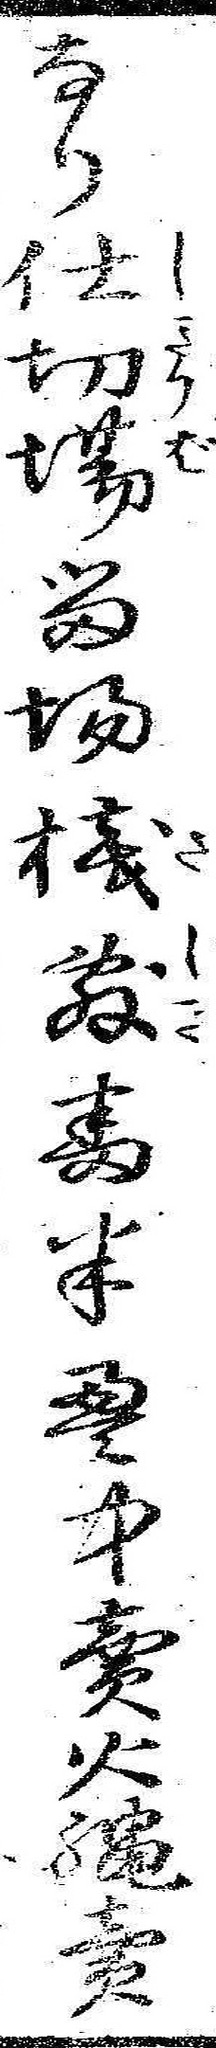なり仕切場留場桟敷番半畳中売火縄売
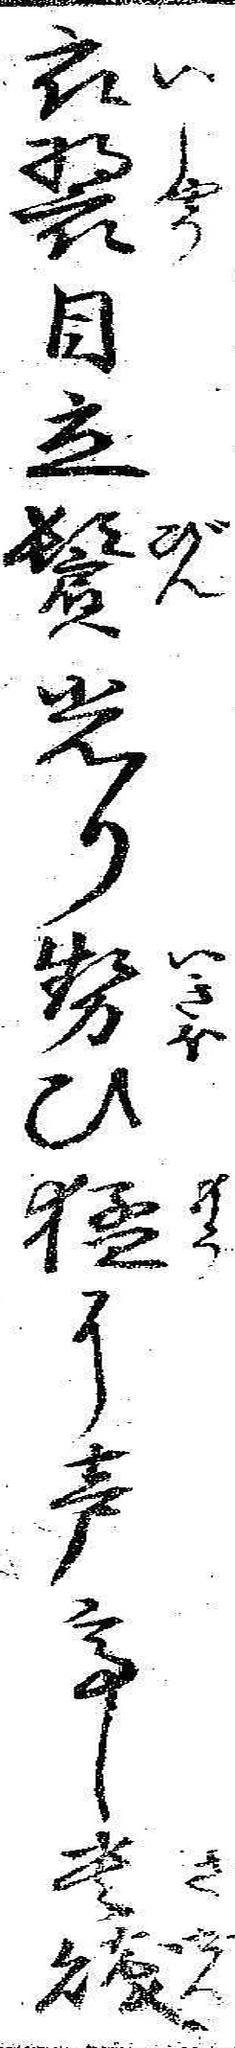衣装目立鬢光り勢ひ猛に声高し貴賎

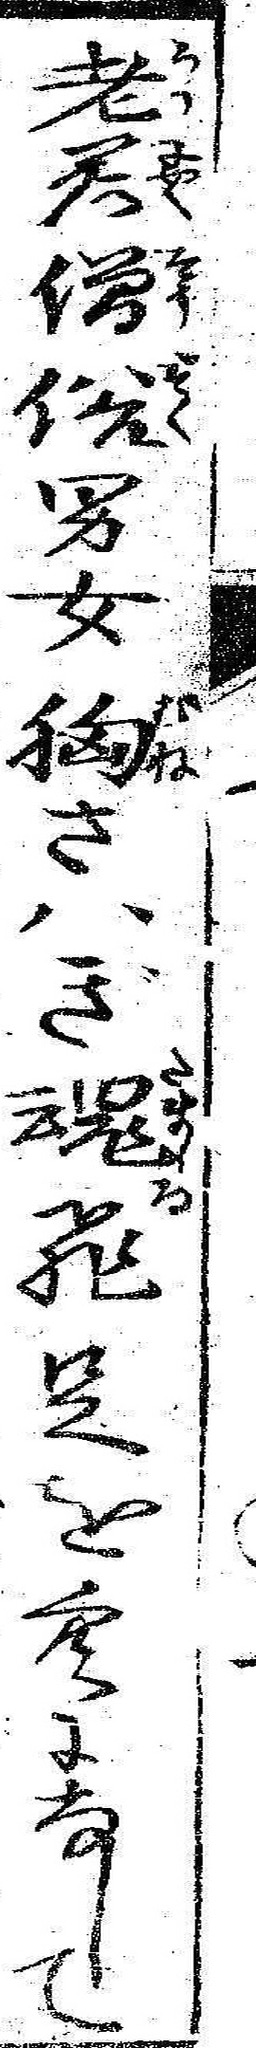老若僧俗男女胸さはぎ魂飛足を空になして
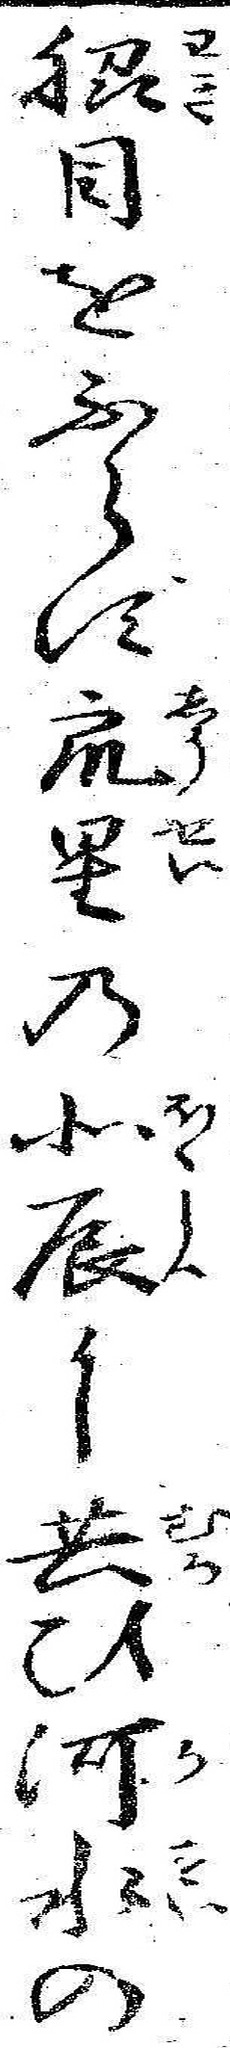脇目をふらず衆星の北辰に共ひ河水の
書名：根無草後編
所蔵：国文学研究資料館
